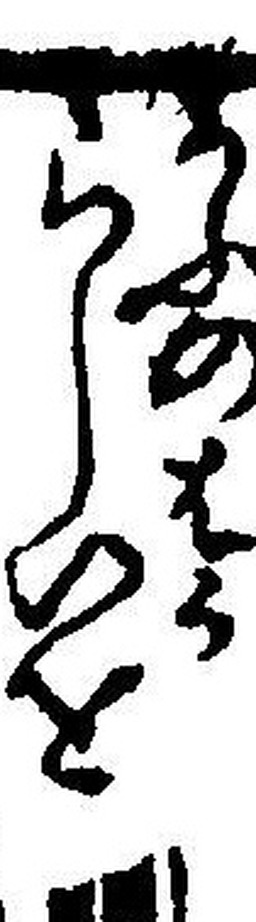らしいを
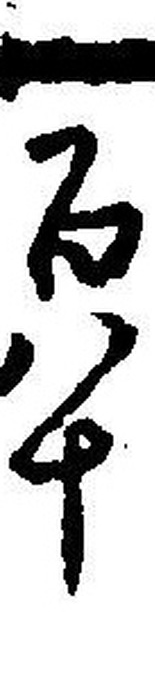百八十
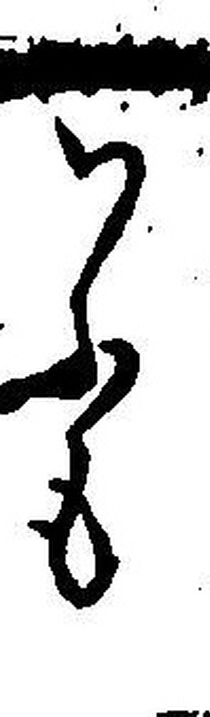いふも
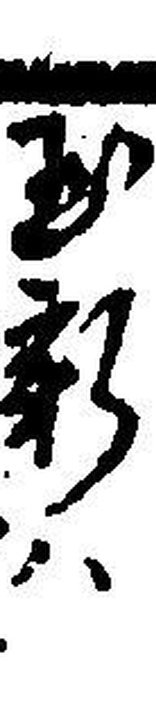玉新は
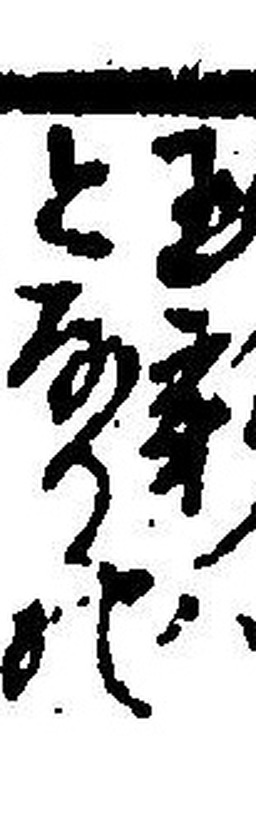となりの
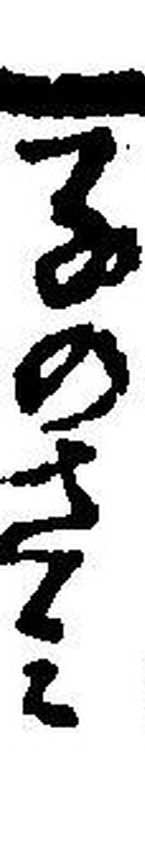子のさみ
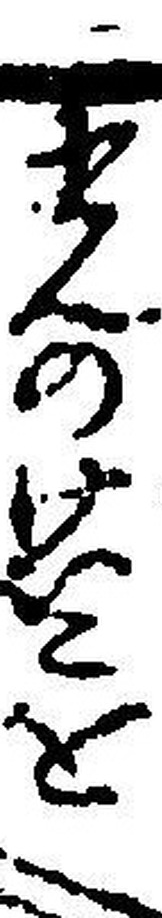せんのけいこを
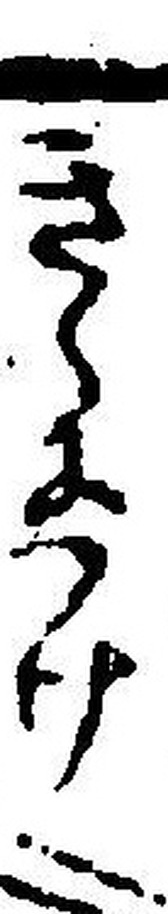きくにつけ
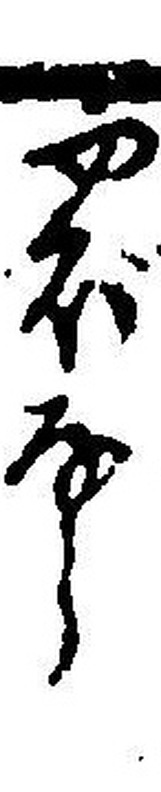やぼなら
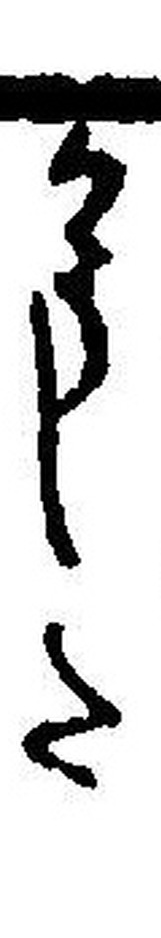かうした
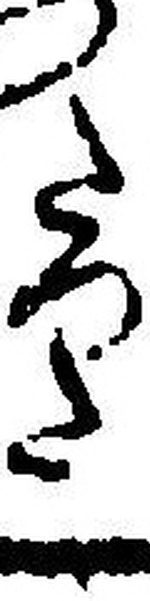たつた
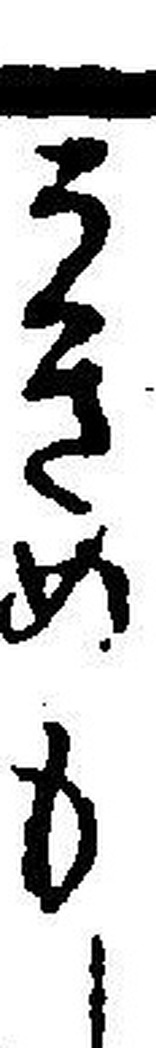うきめも
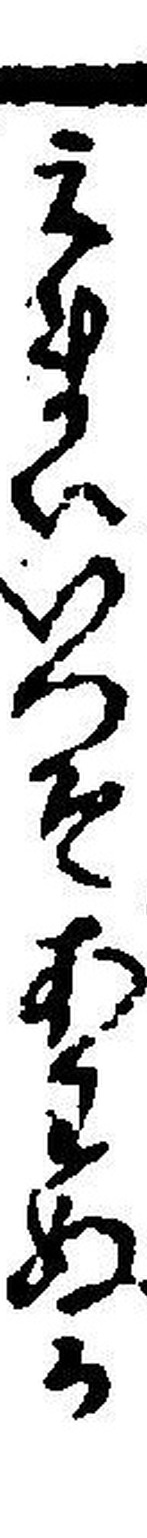みまいいつそあわぬか
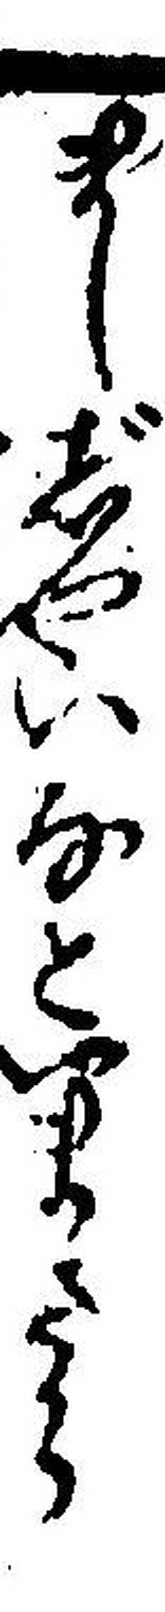ましじやいなといまさら
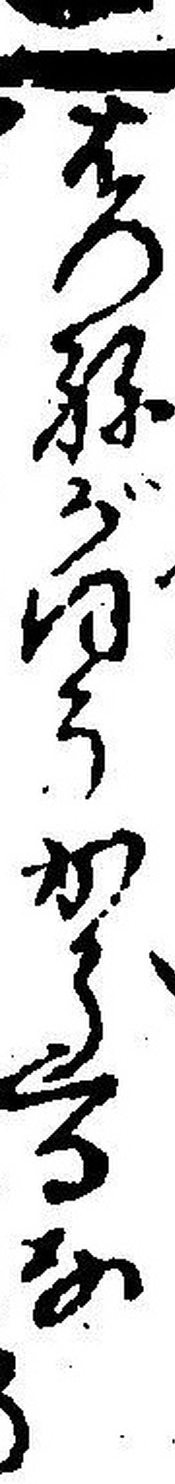はつねがほうからくるな
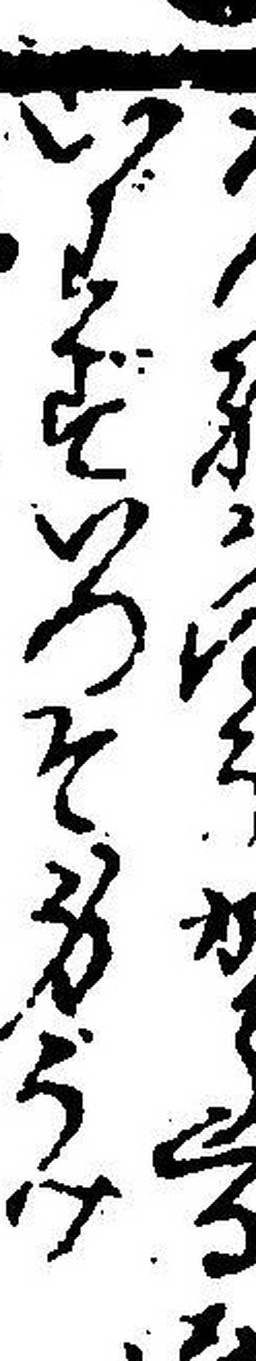いわすいつそ身うけ
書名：間違狐之女郎買 / 市場通笑作
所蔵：東京大学総合図書館 General Library in the University of Tokyo, JAPAN
